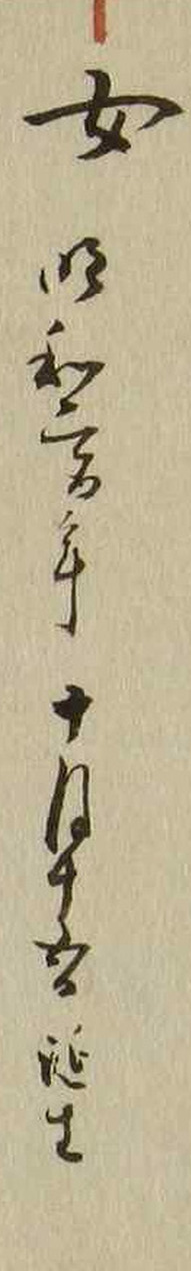女明和六丑年二月四日誕生
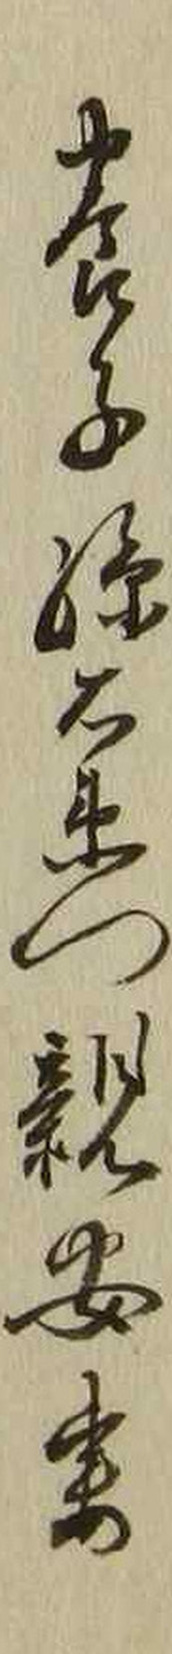養子孫右衛門親安妻
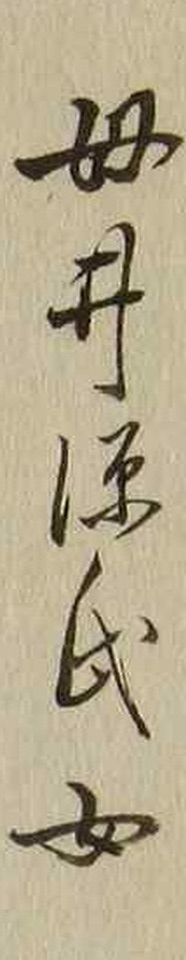母井源氏女
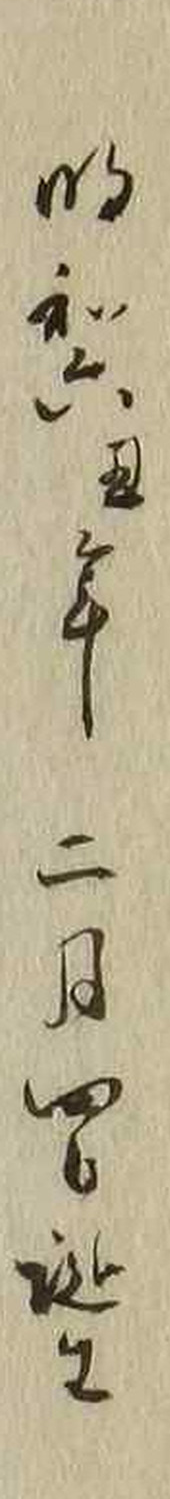女明和六丑年二月四日誕生
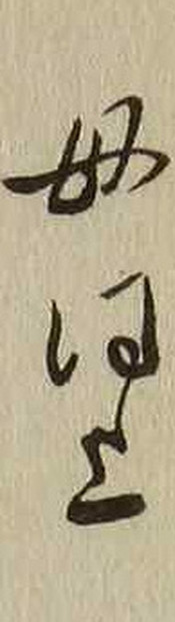母同上
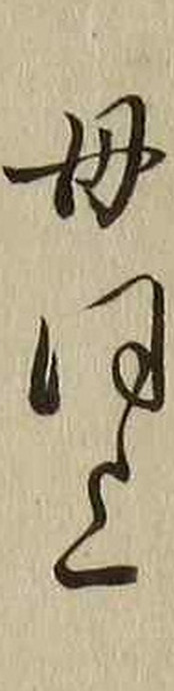母同上
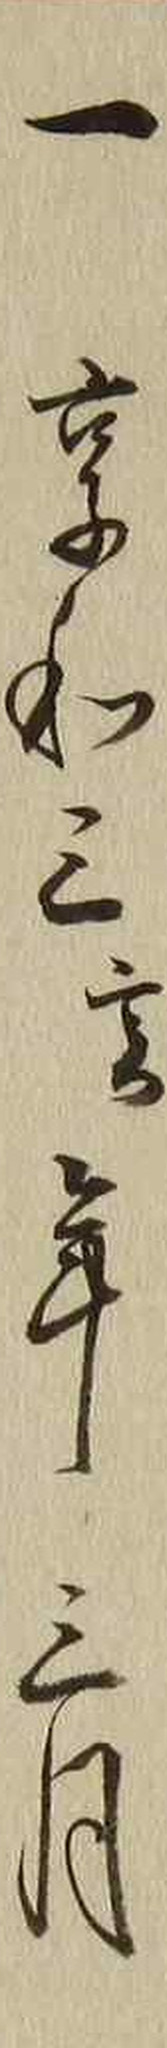一享和三亥年三月
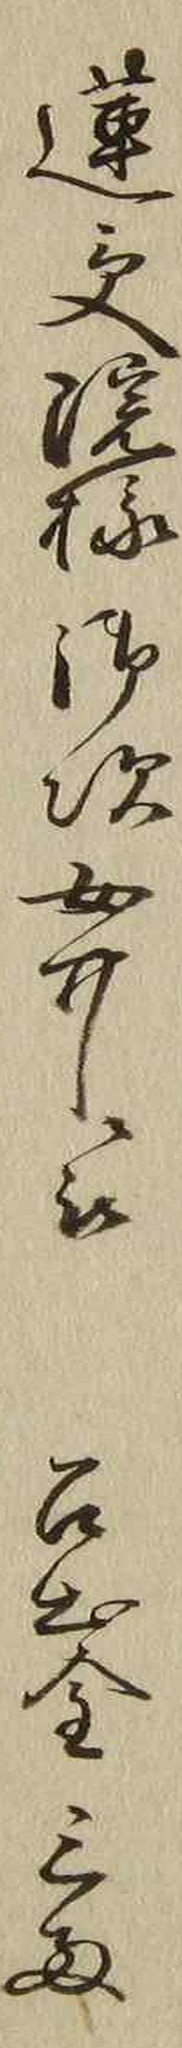蓮受院様御次女中ニ被召出金三両
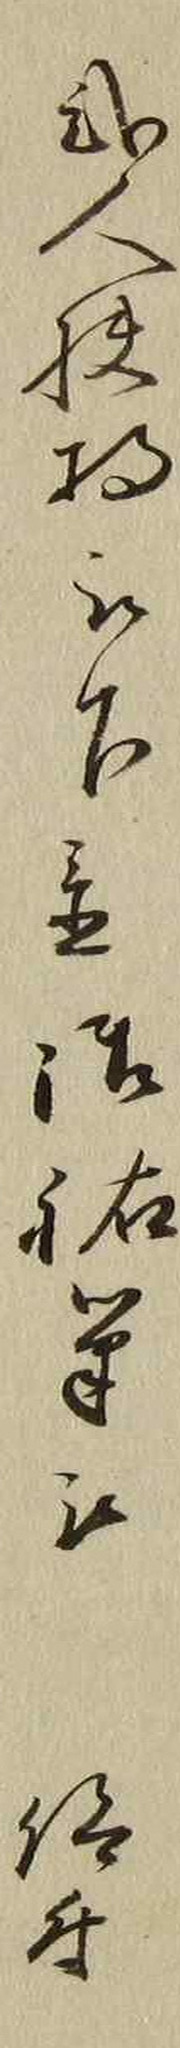弐人扶持被下置御祐筆被仰付
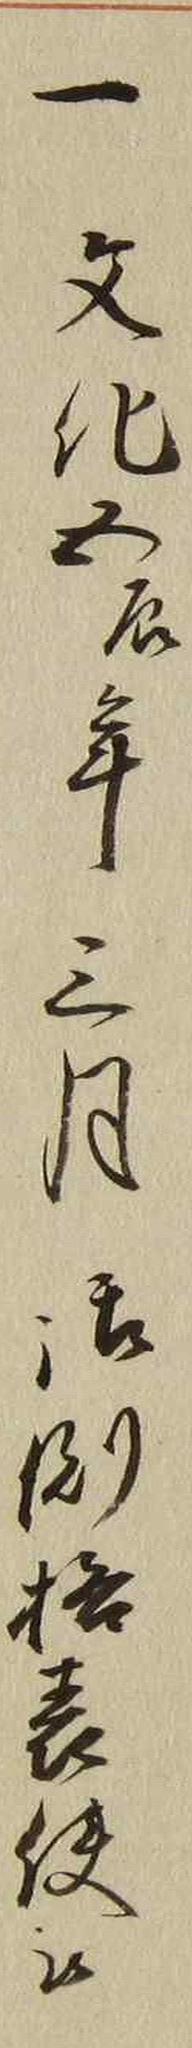一文化五辰年三月御側撫表使被
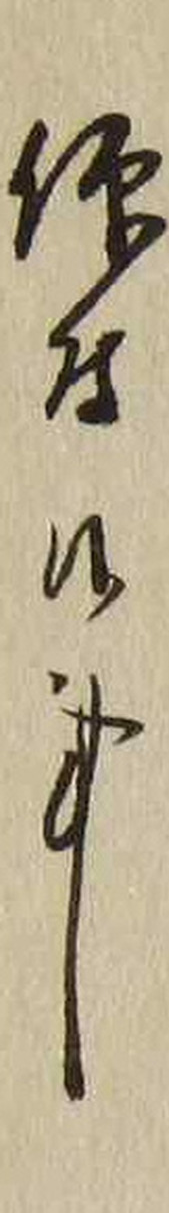仰付候事
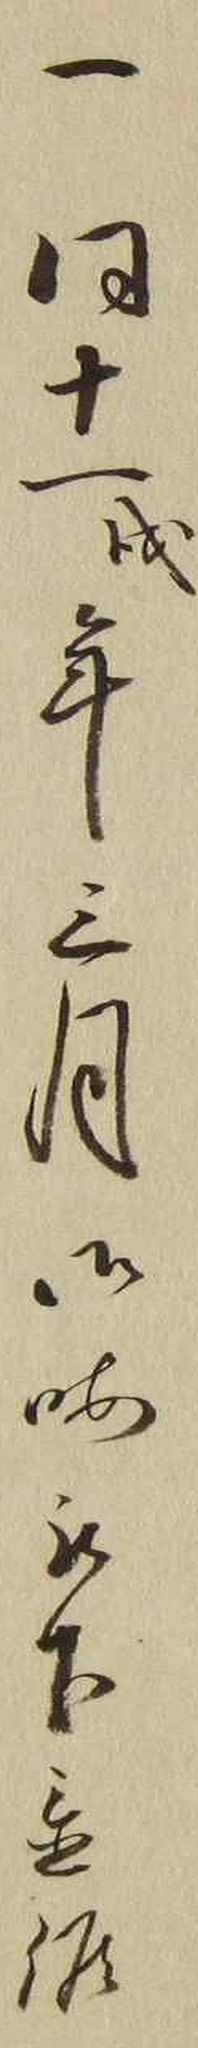一同十一戌年三月御暇被下置候

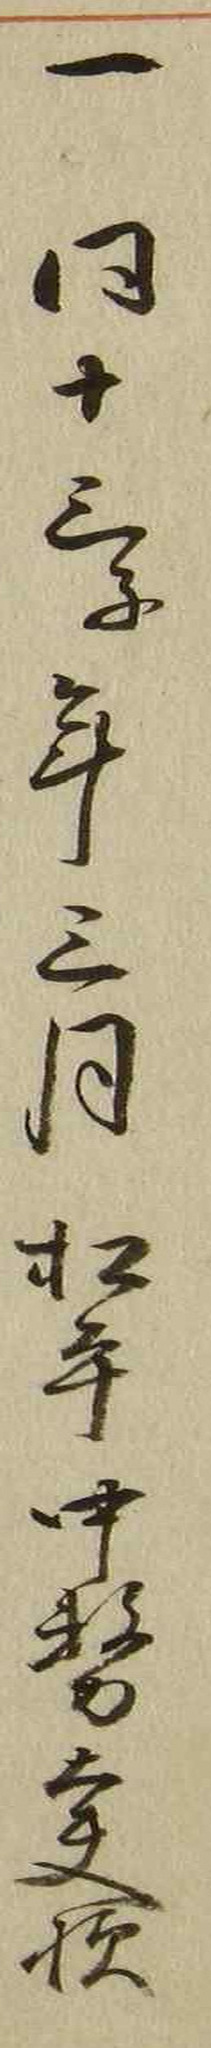一同十三子年三月松平中務太夫様
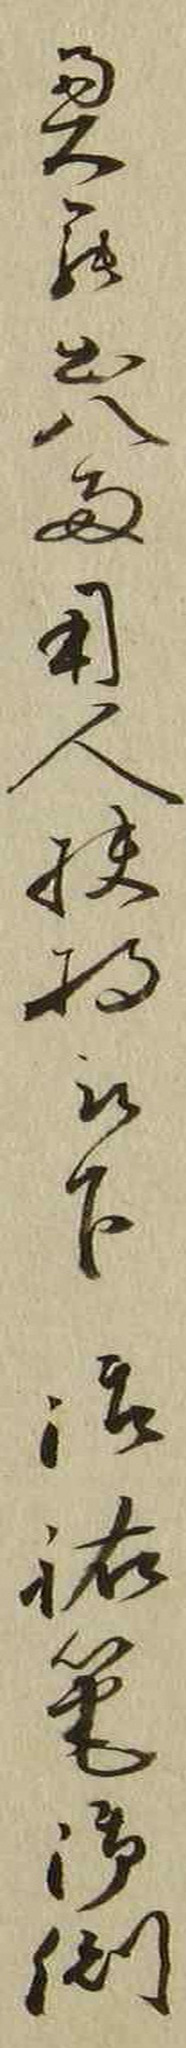奥罷出八両用人扶持被下御祐筆御側
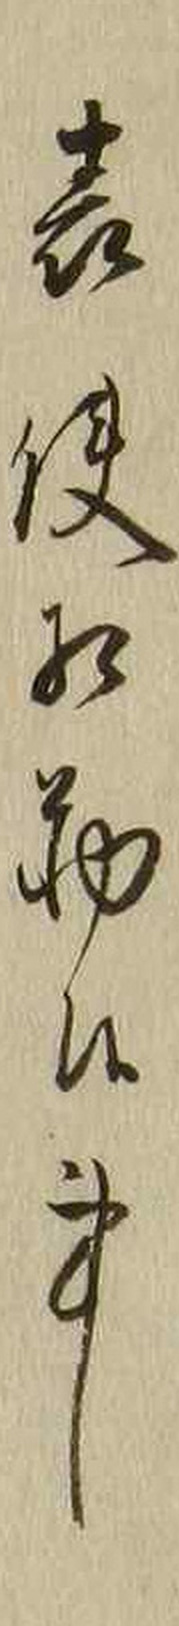表使相勤候事
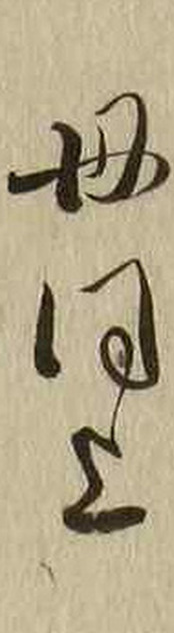母同上
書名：諸士系譜　巻之68　を之部2
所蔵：会津若松市立会津図書館
